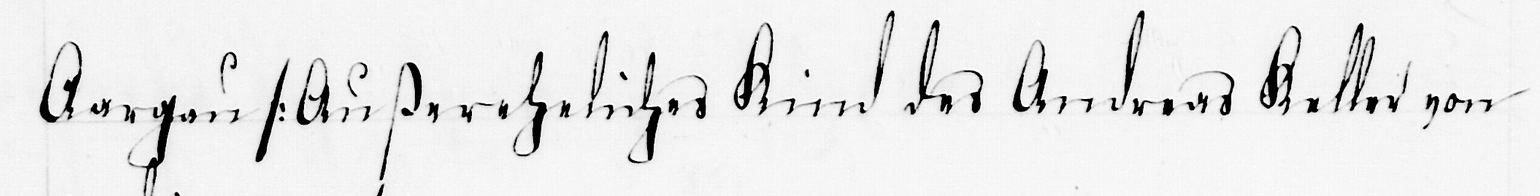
Aargau [Außereheliches Kind des Andreas Keller von
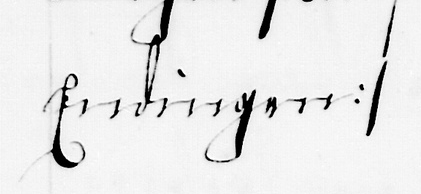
Endingen]
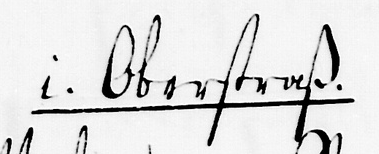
i. Oberstraß.
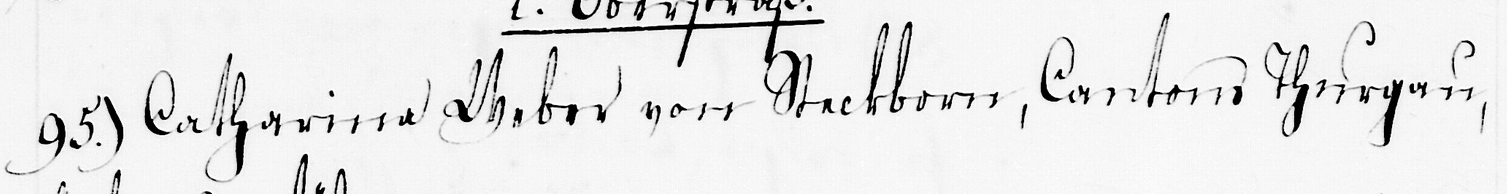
95.) Catharina Weber von Steckborn, Cantons Thurgau,
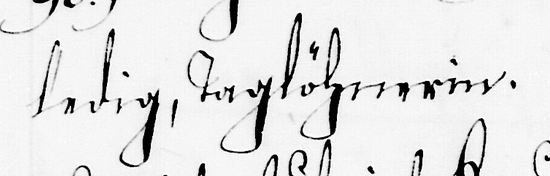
ledig, Taglöhnerin.
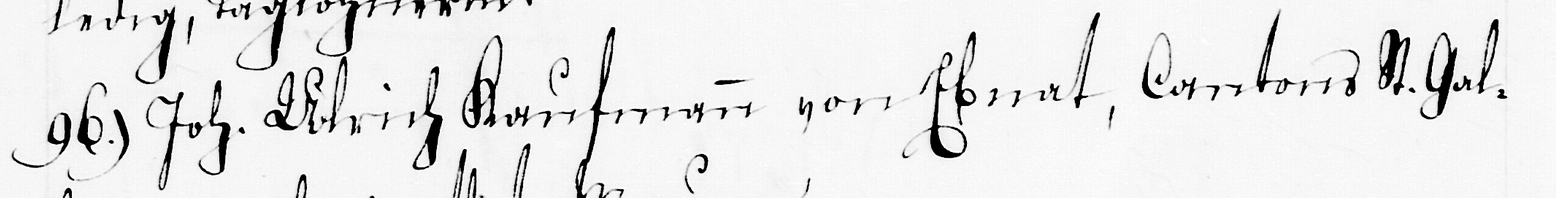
96.) Joh. Ulrich Kaufmann von Ebnat, Cantons St. Gal¬
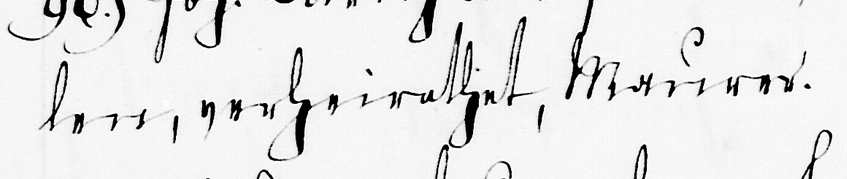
len, verheirathet, Maurer.
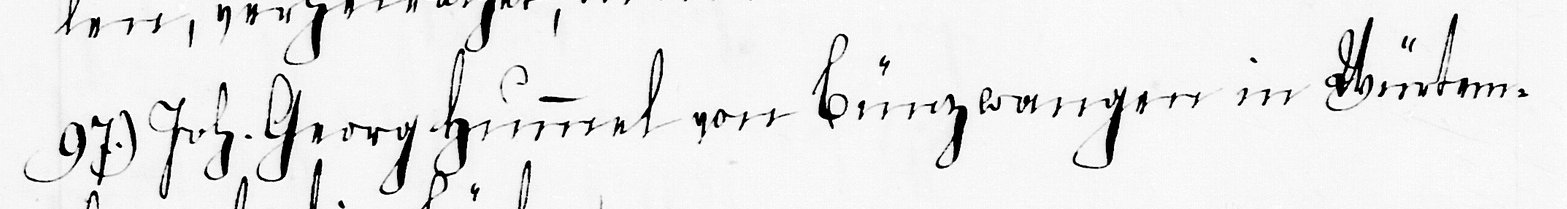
97.) Joh. Georg Hummel von Bünzwangen in Würtem¬
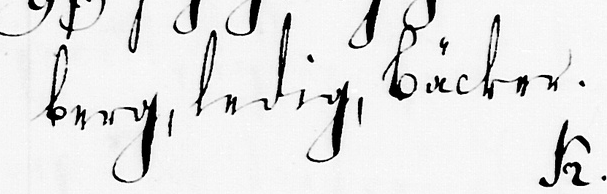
berg, ledig, Bäcker.
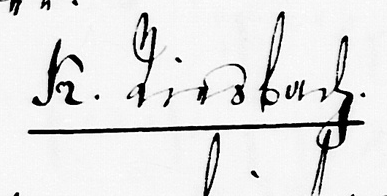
k. Riesbach.
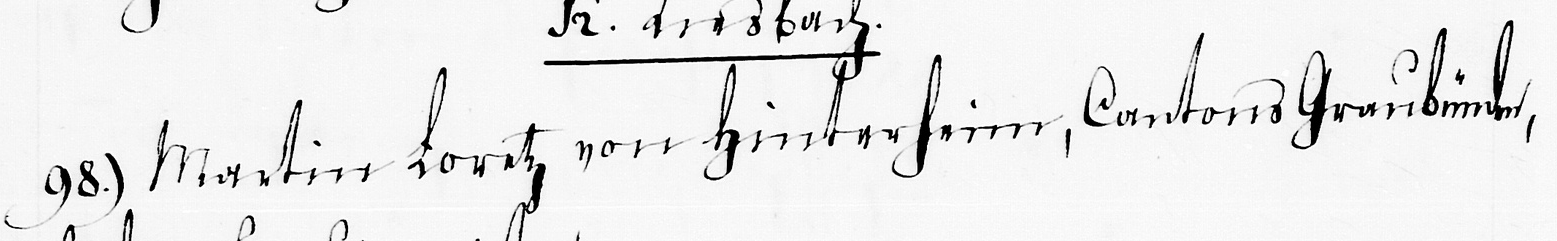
98.) Martin Loretz von Hinterheim, Cantons Graubünd¬
